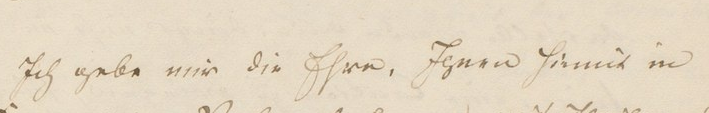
Ich gebe mir die Ehre, Ihnen hiemit in
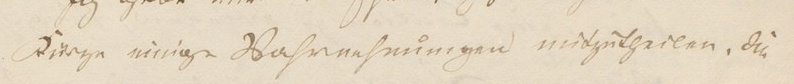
Kürze einige Wahrnehmungen mitzutheilen, die
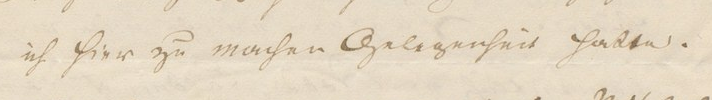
ich hier zu machen Gelegenheit hatte.
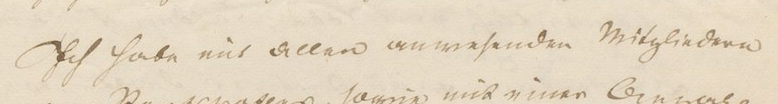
Ich habe mit allen anwesenden Mitgliedern
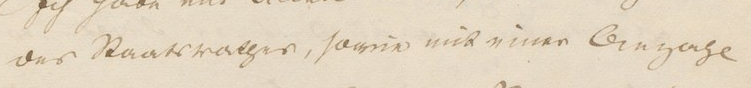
des Staatsrathes, sowie mit einer Anzahl
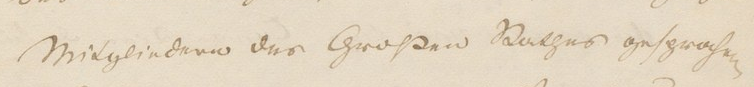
Mitgliedern des Großen Rathes gesprochen.
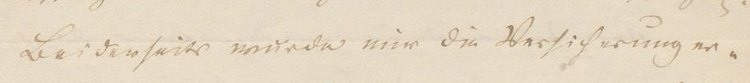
Beiderseits wurde mir die Versicherung er-
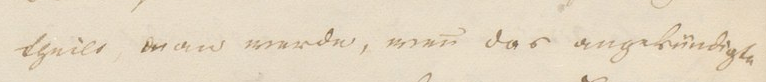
theilt, man werde, wenn das angekündigte
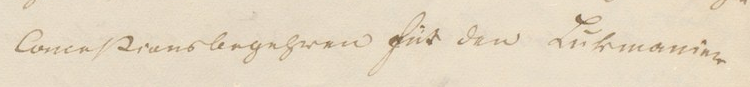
Conceßionsbegehren für den Lukmanier
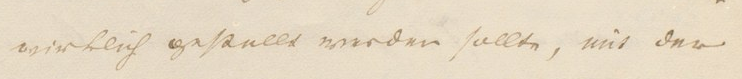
wirklich gestellt werden sollte, mit der
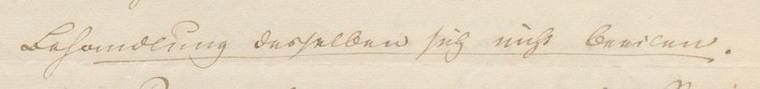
Behandlung desselben sich nicht beeilen.
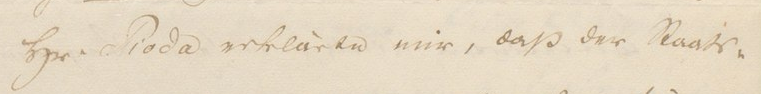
Hr Pioda erklärte mir, daß der Staats-
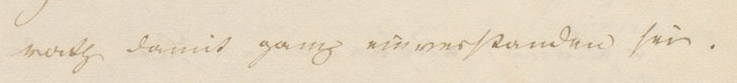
rath damit ganz einverstanden sei.
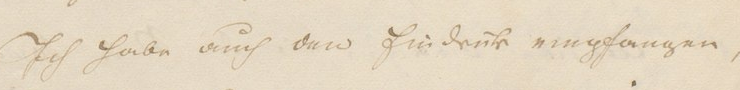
Ich habe auch den Eindruk empfangen,
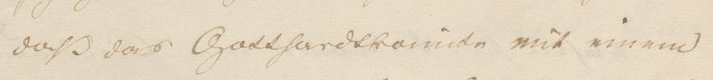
daß das Gotthardtkomite mit einem
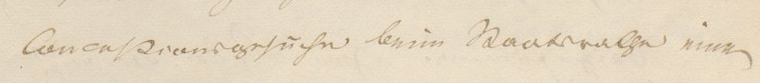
Conceßionsgesuche beim Staatsrathe eine
